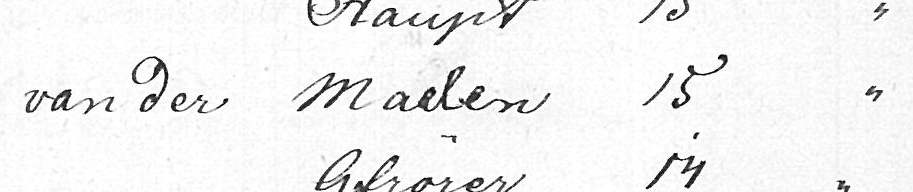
van der Maelen 15 "
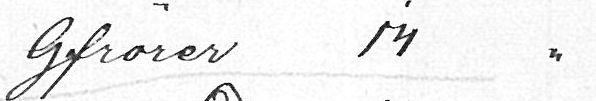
Gfrörer 14 "
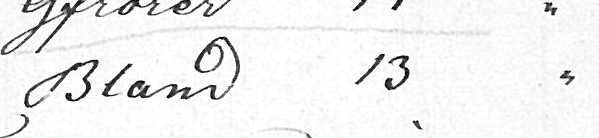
Bland 13 "
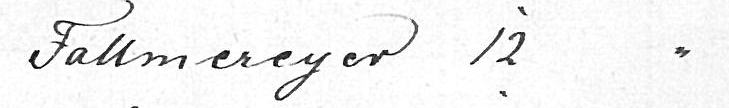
Fallmereyer 12 "
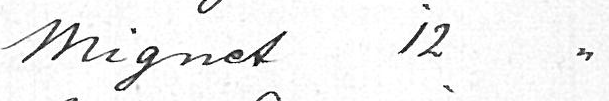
Mignet 12 "
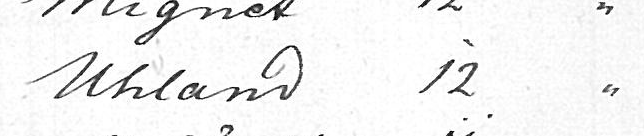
Uhland 12 "
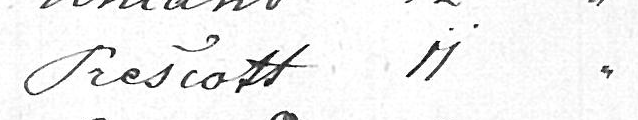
Prescott 11 "
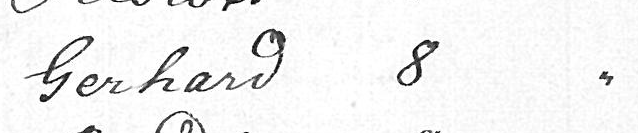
Gerhard 8 "
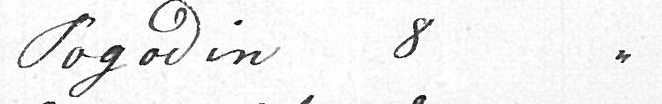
Pogodin 8 "
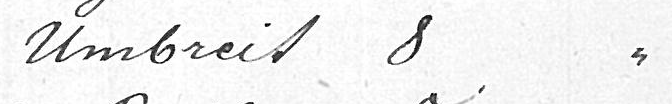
Umbreit 8 "
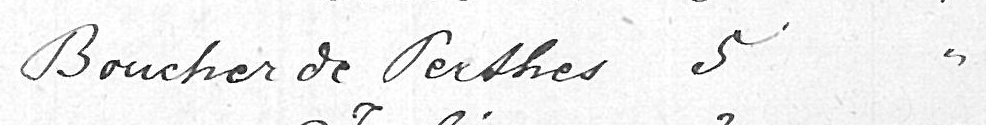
Boucher de Perthes 5 "
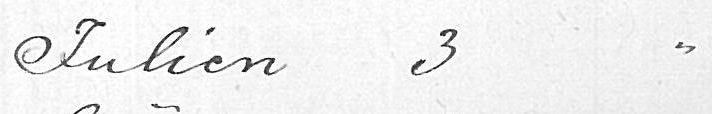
Julien 3 "
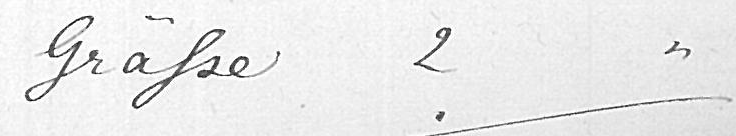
Grässe 2 "
